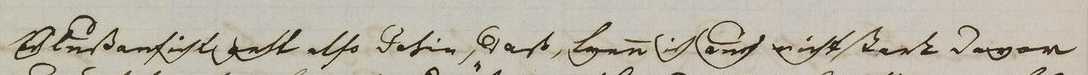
Schlußansicht geht also dahin, «daß, wenn ich auch nicht stark davor
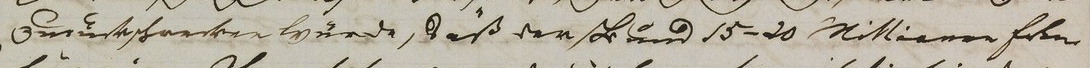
zurückschrecken würde, daß der Bund 15–20 Millionen Frken
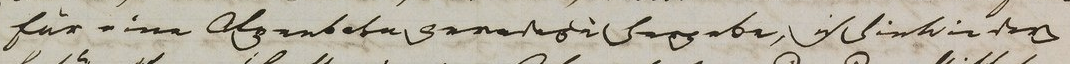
für eine Alpenbahn geradezu hergebe, ich hinwieder
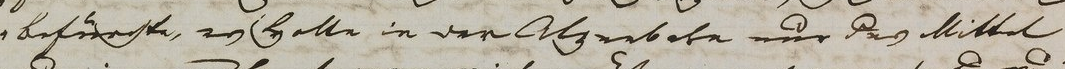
befürchte, es wolle in der Alpenbahn nur das Mittel
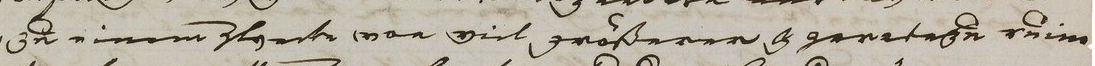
zu einem Zwecke von viel größerer & geradezu ruinö-
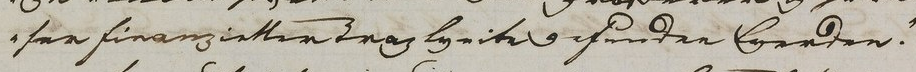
ser finanzieller Tragweite gefunden werden.»
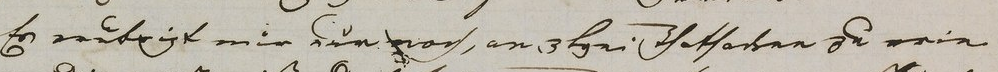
Es erübrigt mir nur noch, an zwei Thatsachen zu erin-
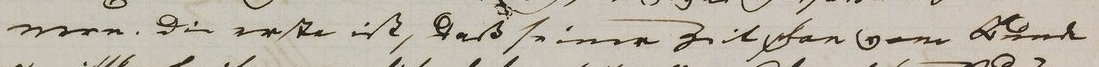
nern. Die erste ist, daß seiner Zeit schon vom Bunde
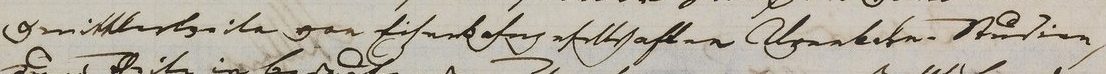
& mittlerweile von Eisenbahngesellschaften Alpenbahn-Studien,
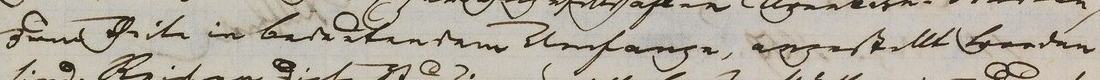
zum Theile in bedeutendem Umfange, angestellt worden
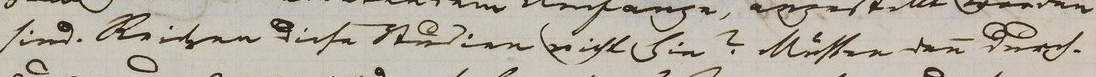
sind. Reichen diese Studien nicht hin? Müssen denn durch-
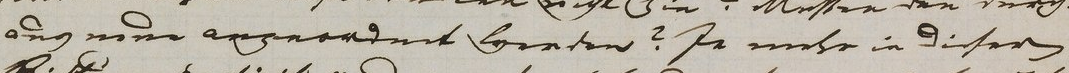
aus neue angeordnet werden? Je mehr in dieser
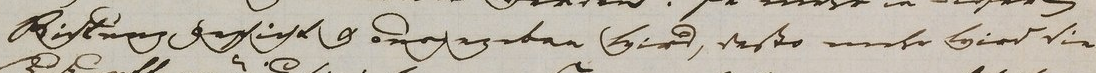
Richtung geschieht & ausgegeben wird, desto mehr wird die
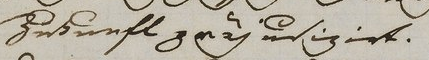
Zukunft präjudizirt.
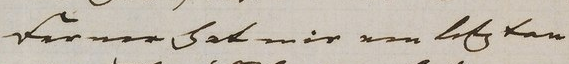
Ferner hat mir am letzten
